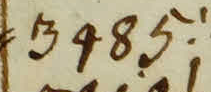3485
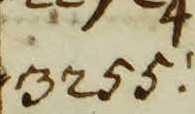3255
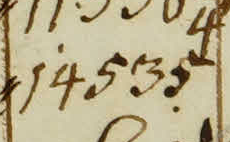14535
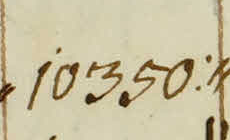10350
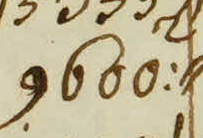9600
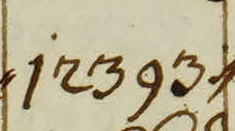12393
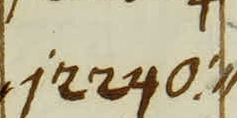12240.
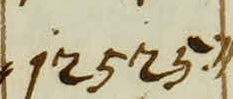12525
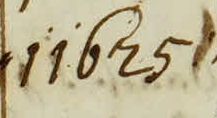11625
